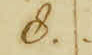8.
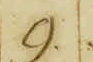9.
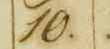10.
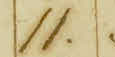11.
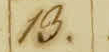13.
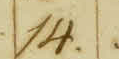14.
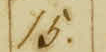15.
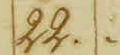22.
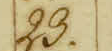23.
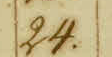24.
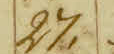27.
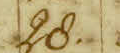28.
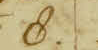8.
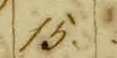15.
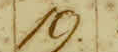19.
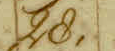28.
